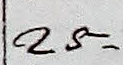25
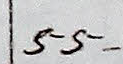55
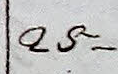25
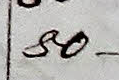80
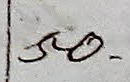50
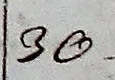30
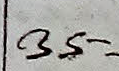35
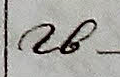26
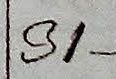31
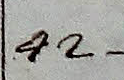42
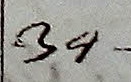34
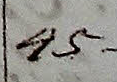45
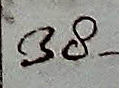38
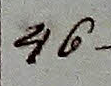46
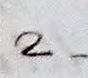2
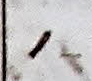1
